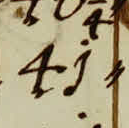41
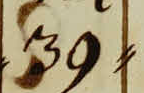39
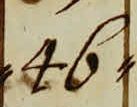46
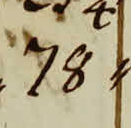78
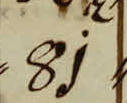81
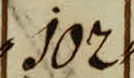102
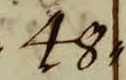48
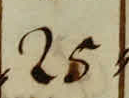25
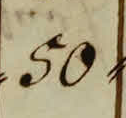50
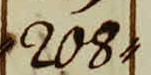208
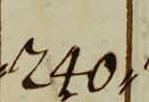240
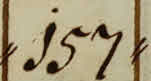157
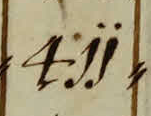411
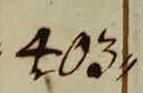403
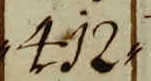412
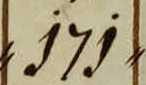171
